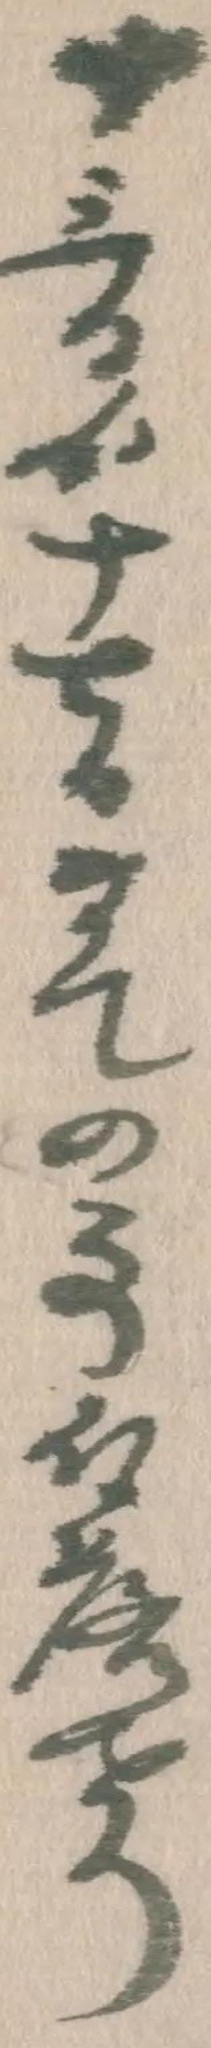十三日ゟ十七日まての事付落せり
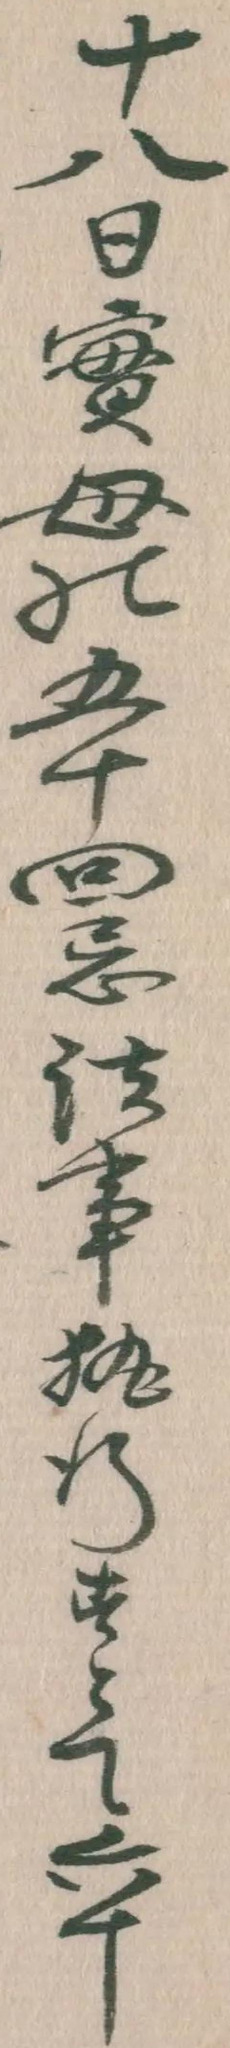十八日実母の五十回忌法事執行すとて六十
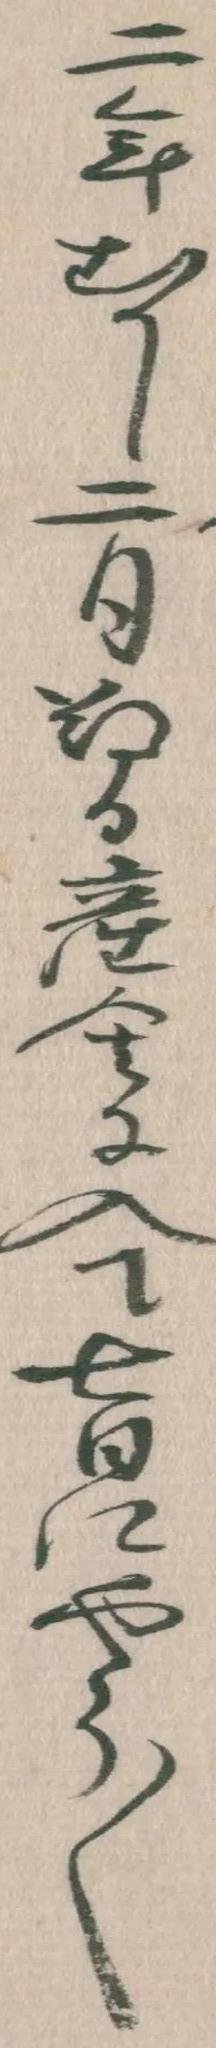二年むかし二月朔日産舎に入て七日にやう〳〵
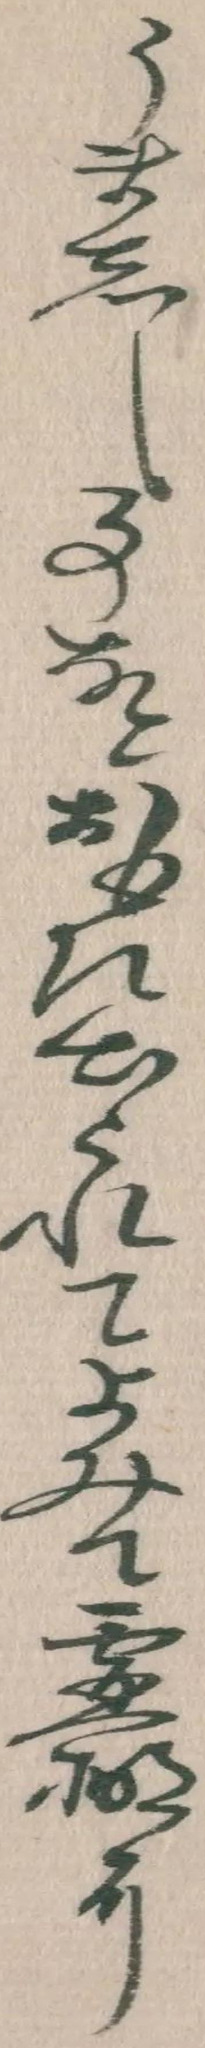うましし事なとおもひ出られてよみて霊棚に
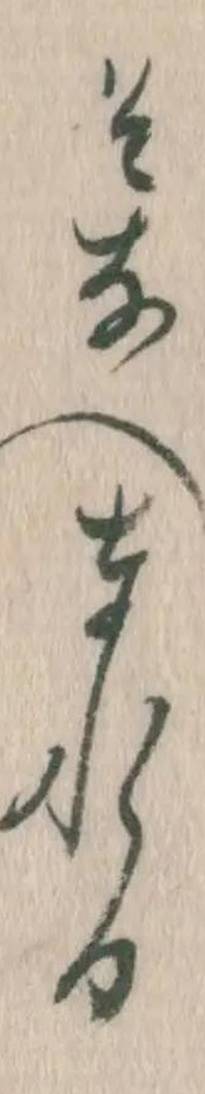そなへ奉れる
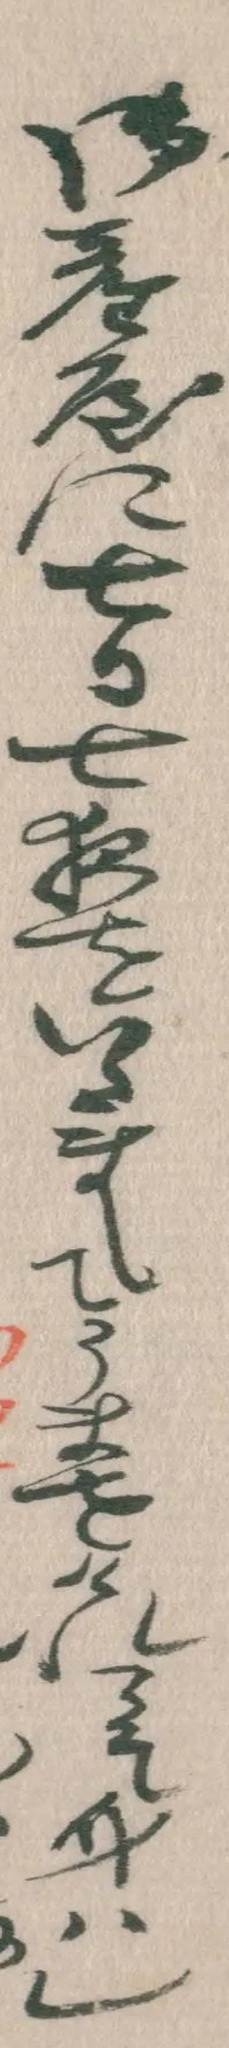御産屋に七日七夜をいたましてうませけれこそ見はかくてあれ
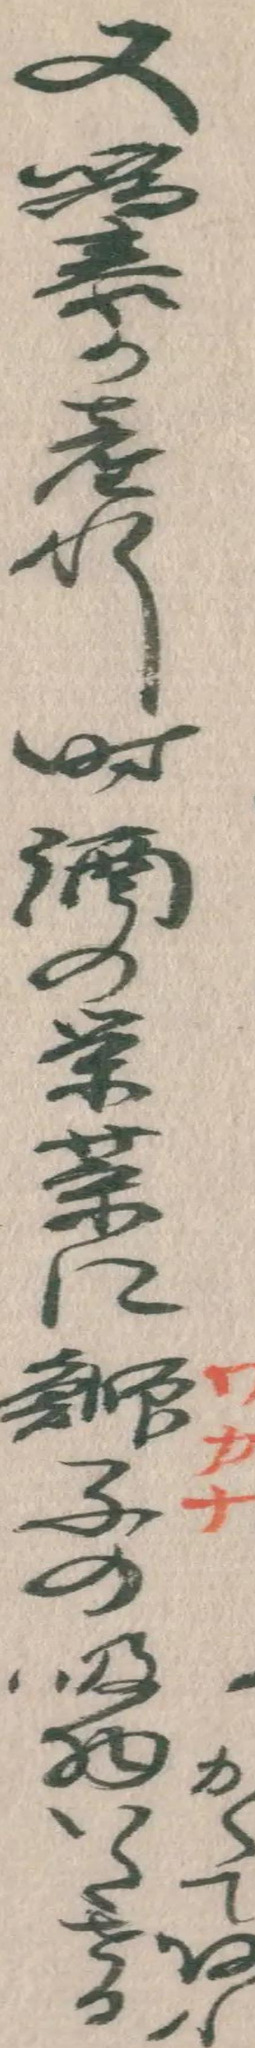又為泰の産れし時酒の栄菜に鰤子の吸物いたせる
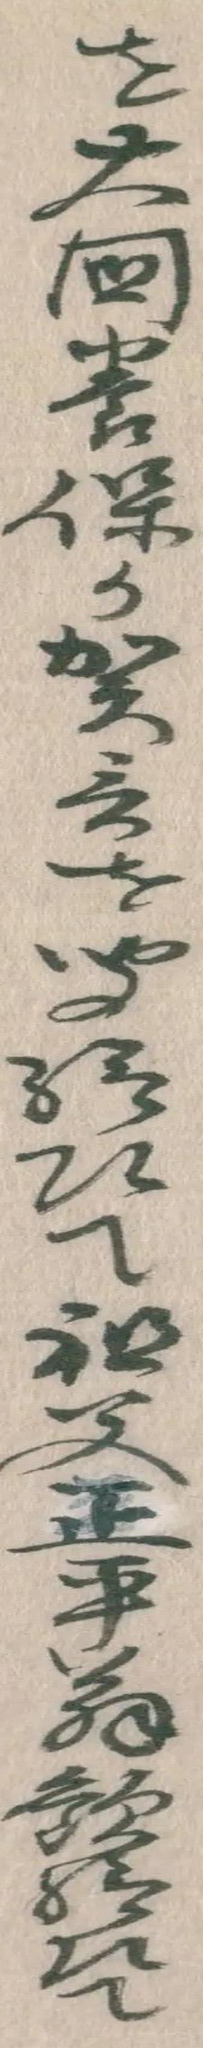を大国養保か賀言を聞給ひて祖父正平翁歓給ひて
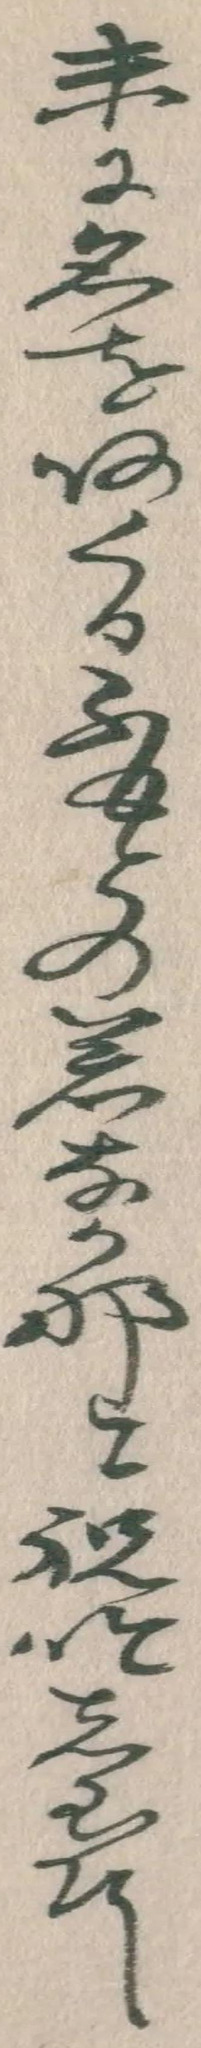末に名をあくるふもとの若なかやと祝吟し玉ひし
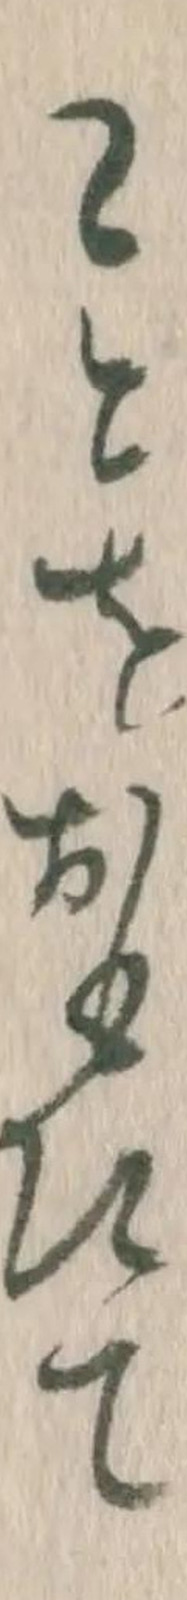ことをおもひて
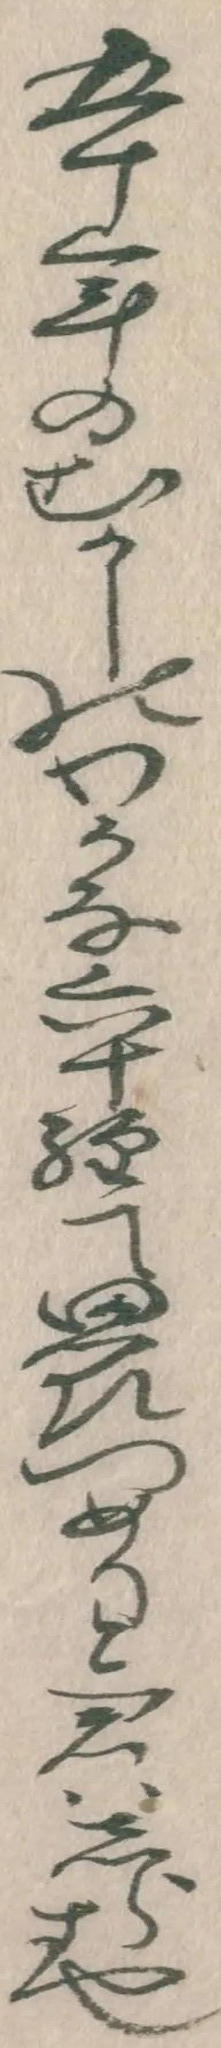五十年のむかしのわかな六十経て思ひつめりと君にしらすや

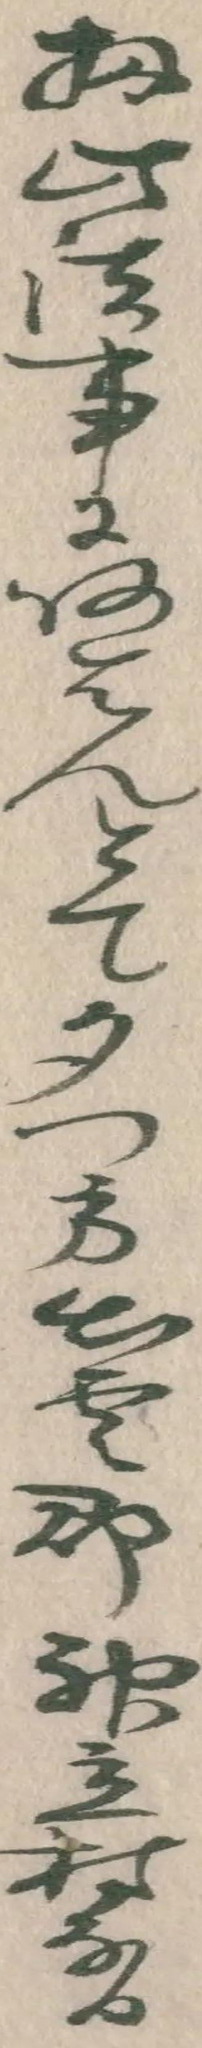扨此法事にあはんとて夕つ方出雲郡神立村なる
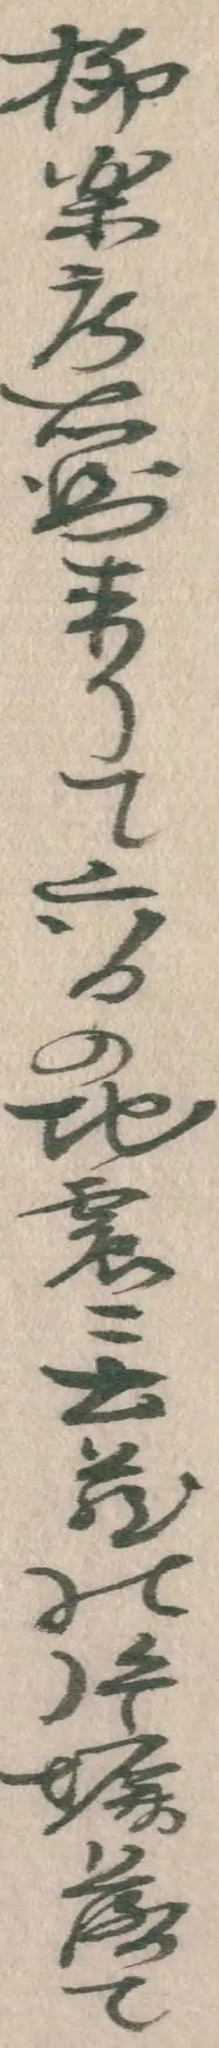柳楽庄右衛門来りて六日の地震に土蔵の片塀落て
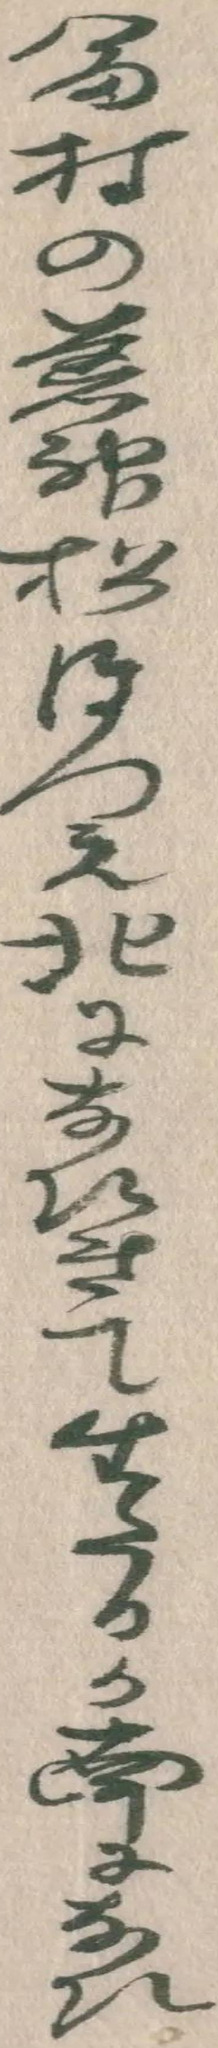冨村の荒神松ほつえ北になひきて生たるか南になひ
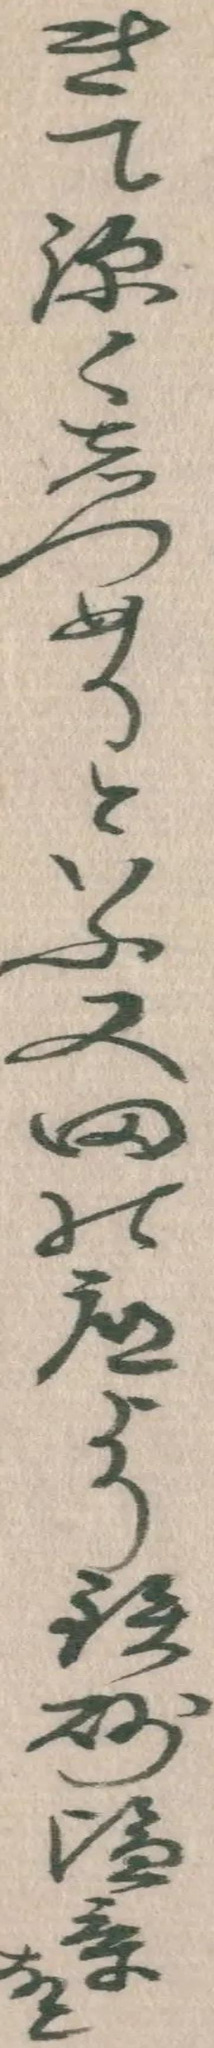きて深くしつめりといふ又田の底より鉄砂塩気なと
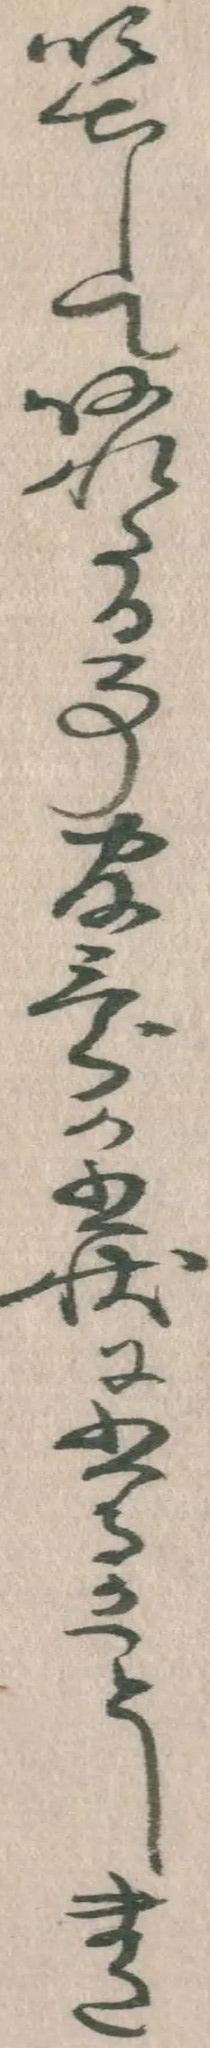吹出してあれたる事官三郎の書状に書るかことしまた
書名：出雲紀行. 20
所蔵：国立国会図書館 National Diet Library, JAPAN
